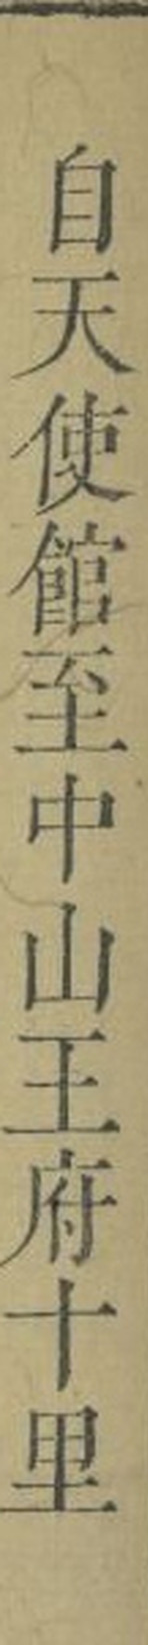自天使館至中山王府十里
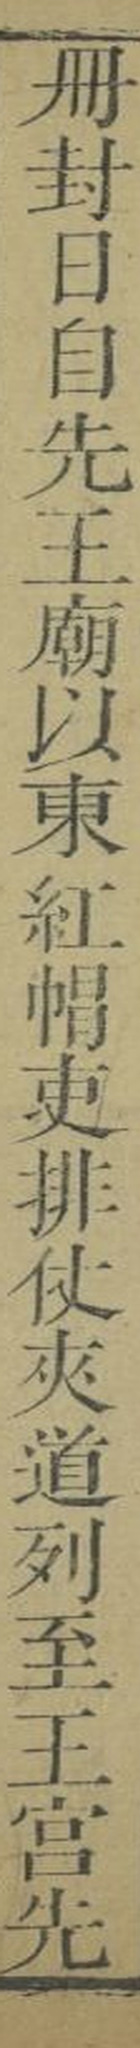冊封日自先王廟以東紅帽吏排仗夾道列至王宫先
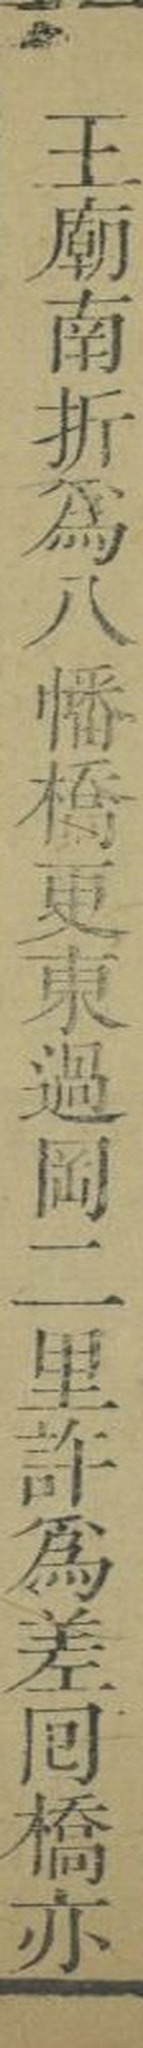王廟南折爲八幡橋更東過岡二里許爲差囘橋亦
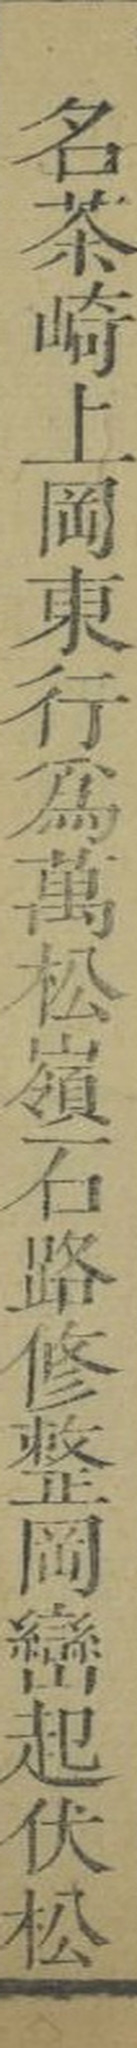名茶崎上岡東行爲萬松嶺石路修整岡巒起伏松
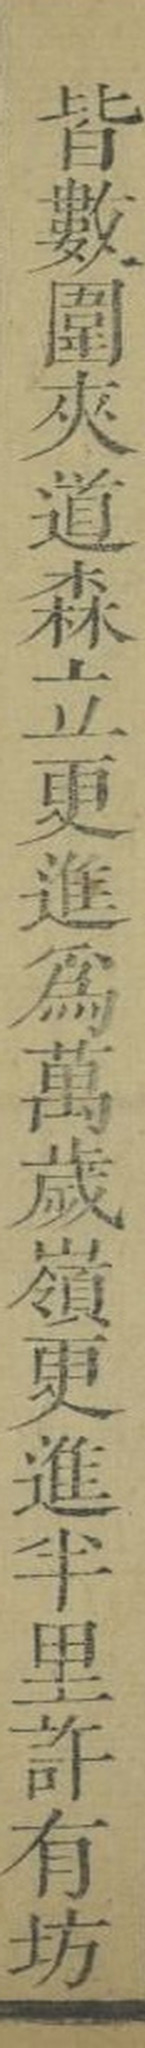皆數圍夾道森立更進爲萬歲嶺更進半里許有坊
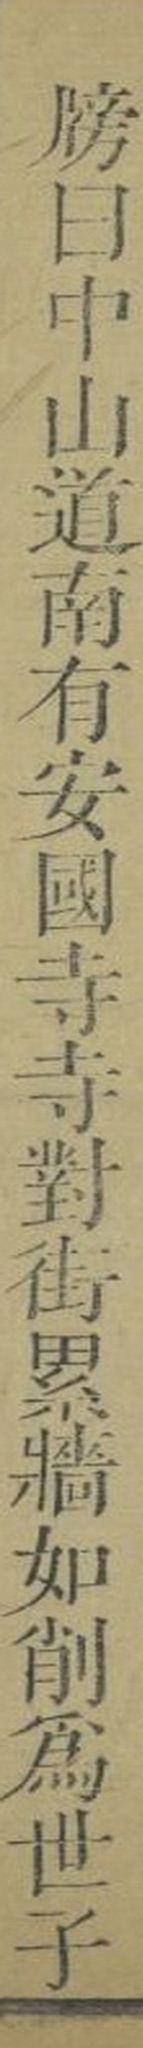牓曰中山道南有安國寺寺對街累牆如削爲世子
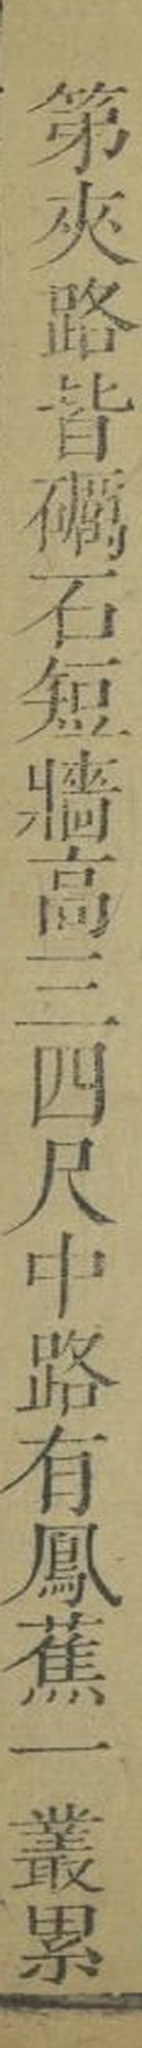第夾路皆礪石短牆高三四尺中路有鳳蕉一叢累
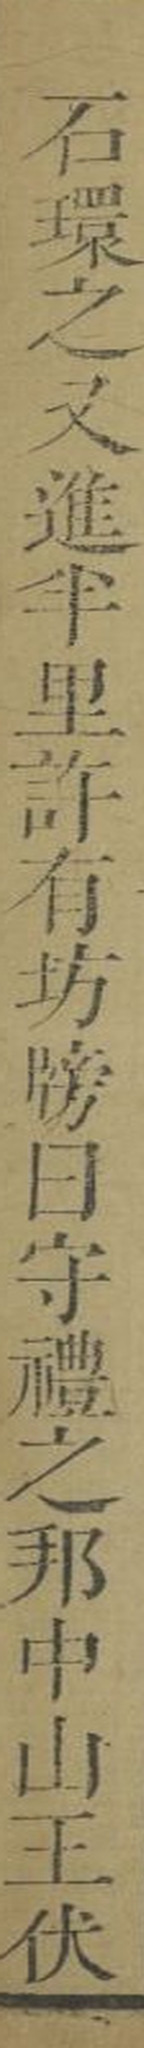石環之又進半里許有坊牓曰守禮之邦中山王伏

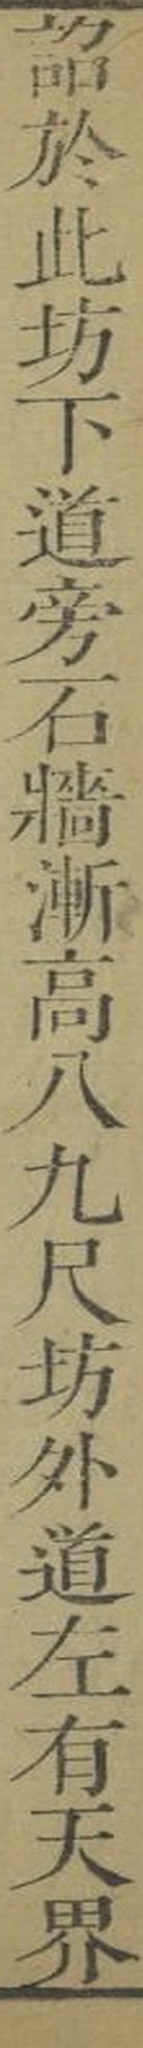詔於此坊下道旁石牆漸高八九尺坊外道左有天界
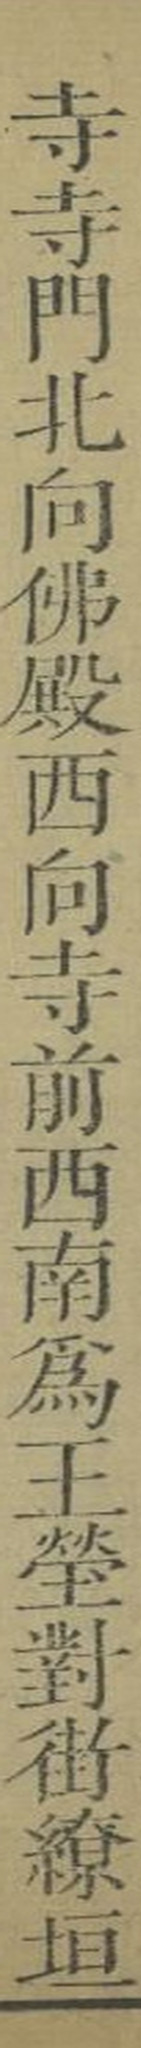寺寺門北向佛殿西向寺前西南爲王塋對街繚垣
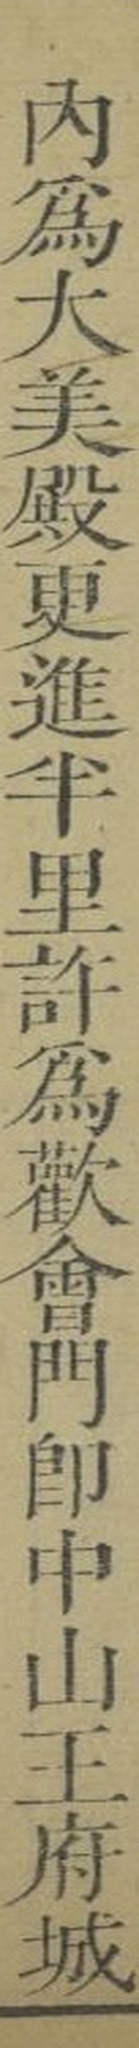内爲大美殿更進半里許爲歡會門卽中山王府城
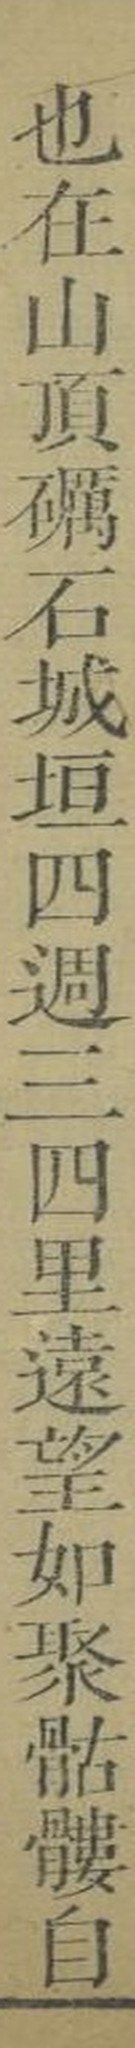也在山頂礪石城垣四週三四里遠望如聚骷髏自
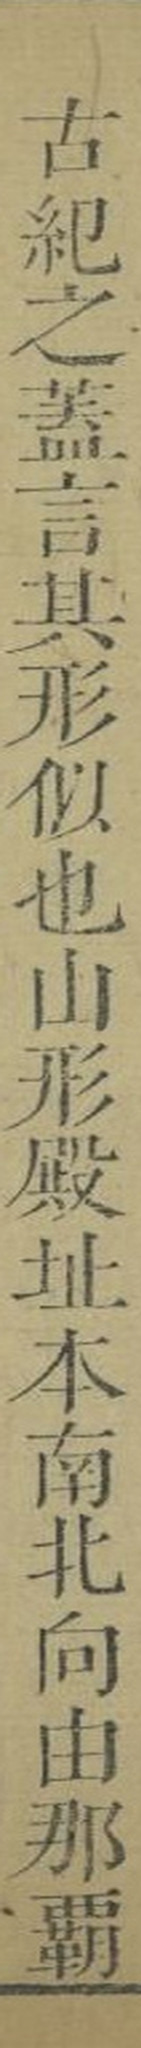古紀之蓋言其形似也山形殿址本南北向由那覇
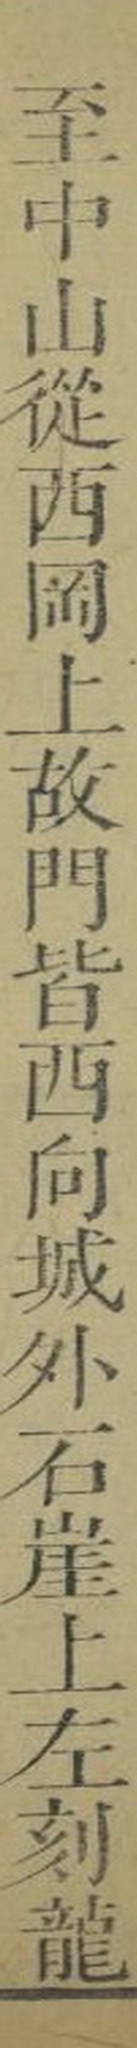至中山從西岡上故門皆西向城外石崖上左刻龍
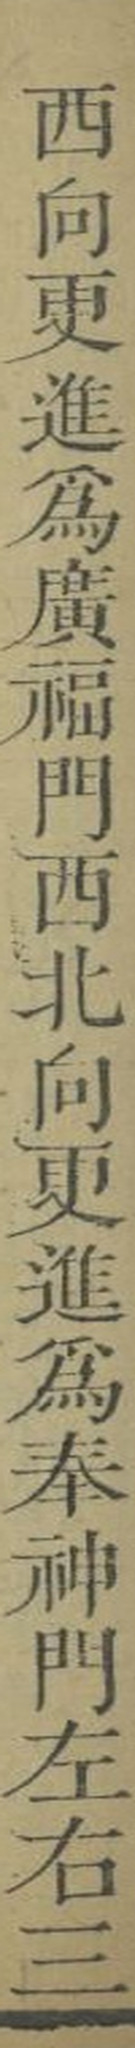西向更進爲廣福門西北向更進爲奉神門左右三
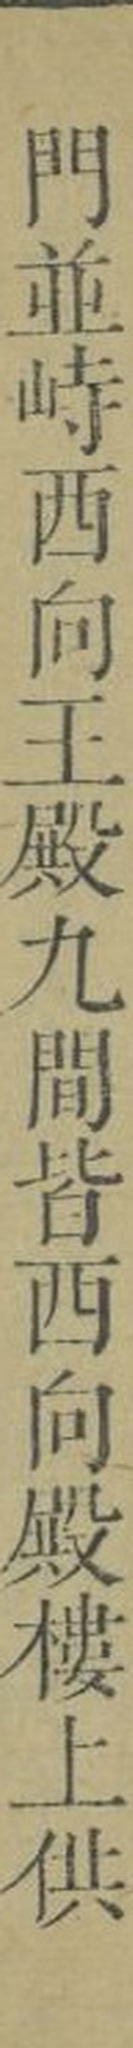門並峙西向王殿九間皆向殿樓上供
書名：中山伝信録 巻二
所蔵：University of the Ryukyus Library
